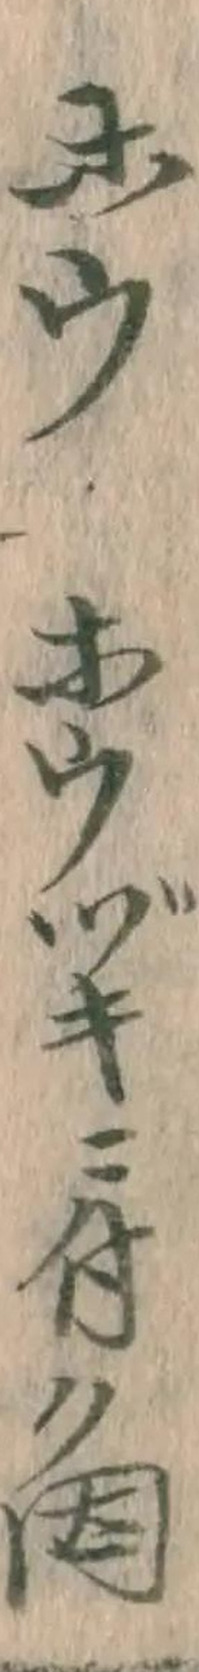ホウホウヅキニ付ク因
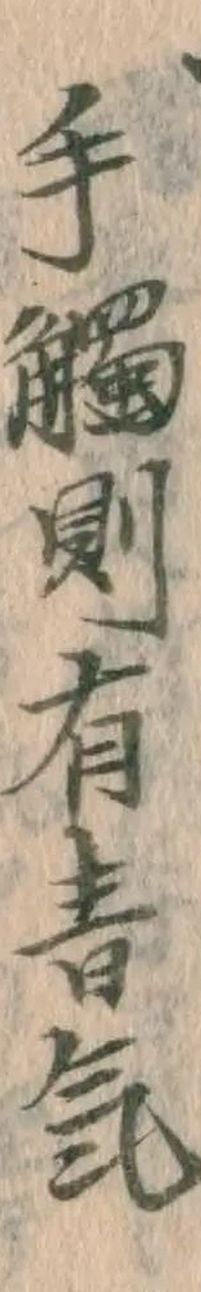手触則有青気
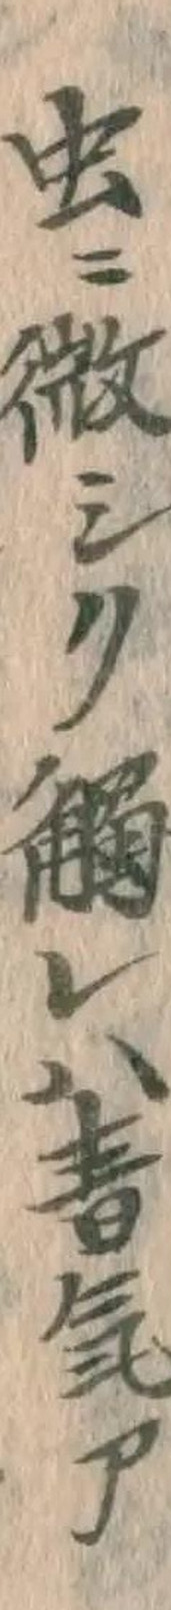虫ニ微シク觸レハ青気ア
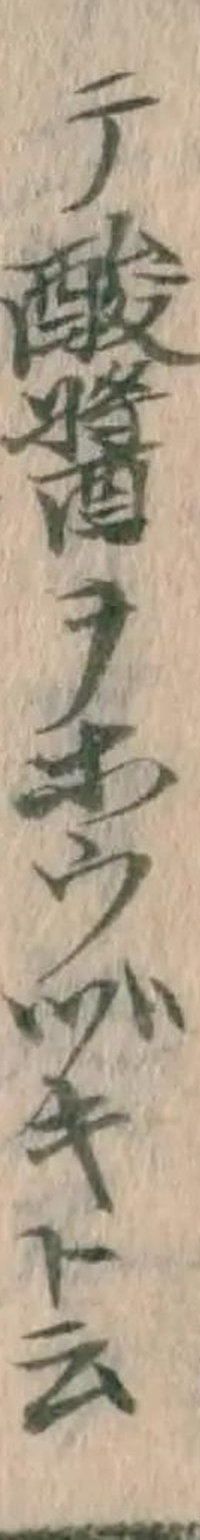テ酸醤ヲホウヅキと云
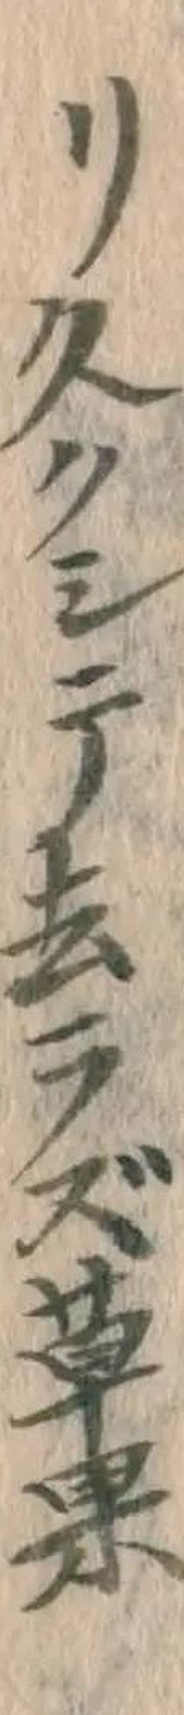リ久シクシテ去ラズ草果
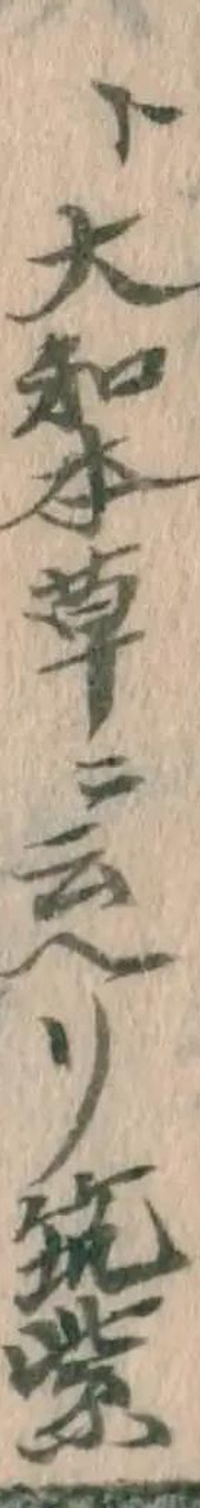ト大和本草ニ云ヘリ筑紫
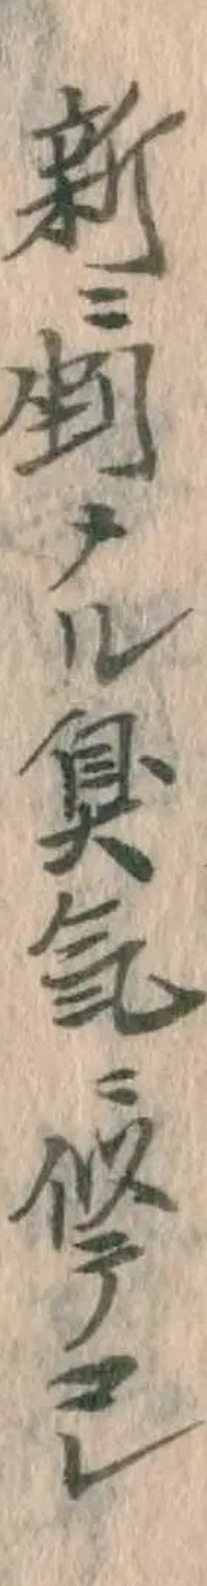新ニ剉メル臭気ニ似テコレ
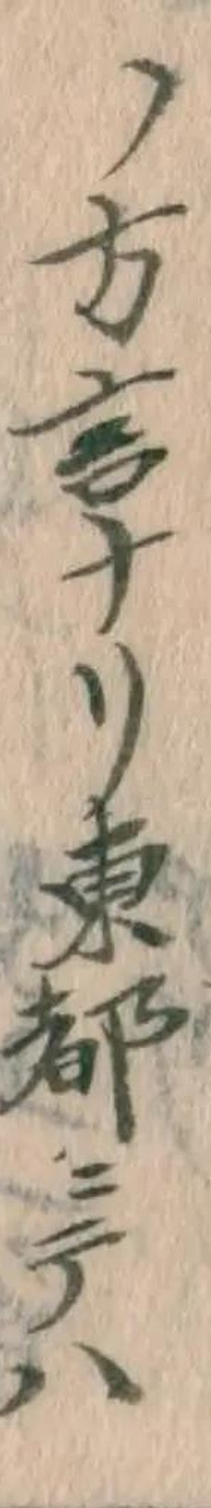ノ方言ナリ東都ニテハ
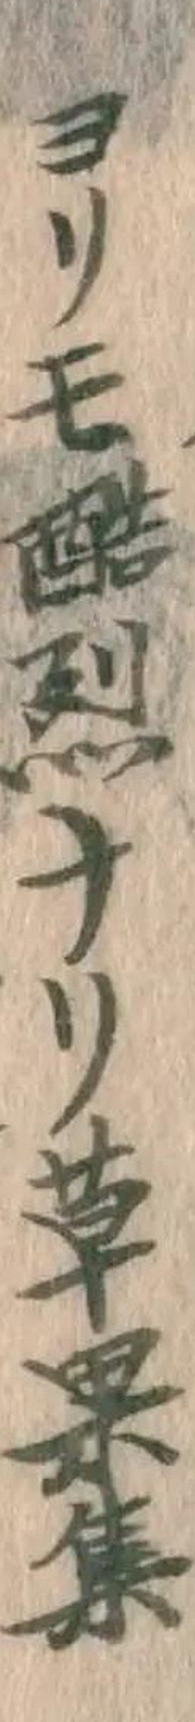ヨリモ酷烈ナリ草果集
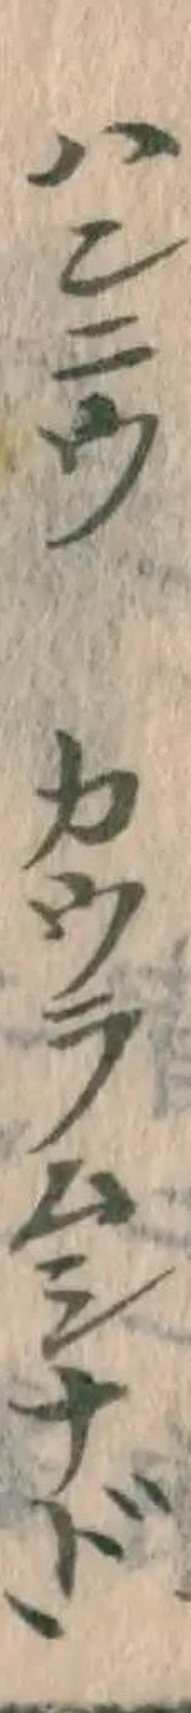ハンニウカウラムシナドヽ
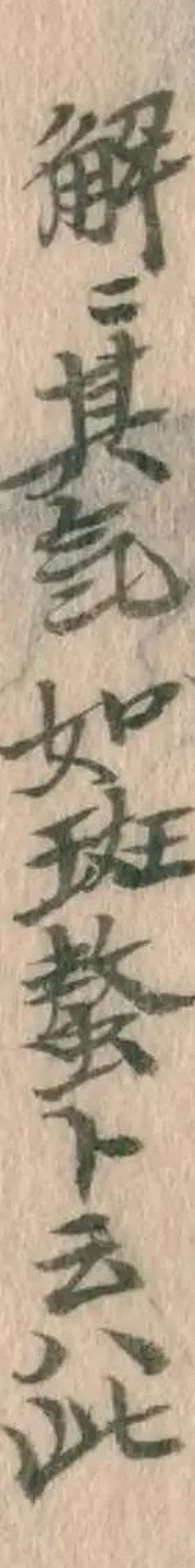解ニ其気如斑螫ト云ハ此
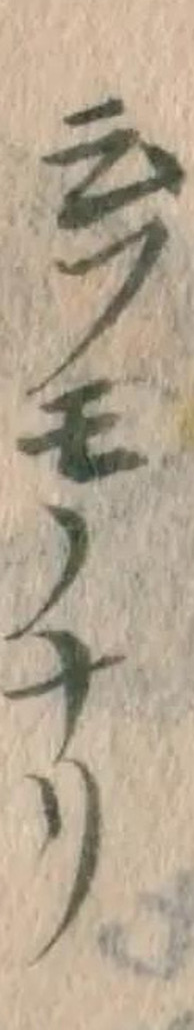云フモノナリ
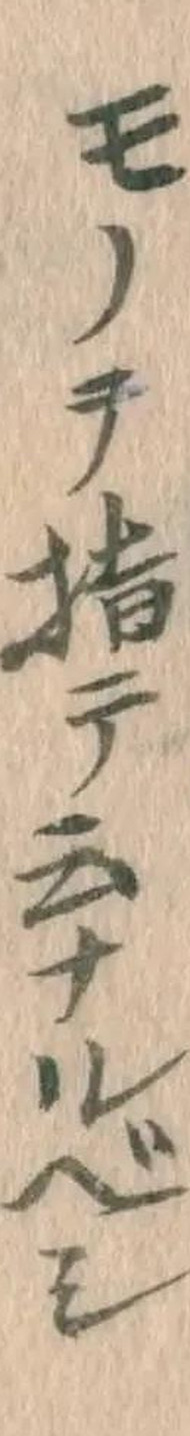モノヲ指テ云ナルベシ
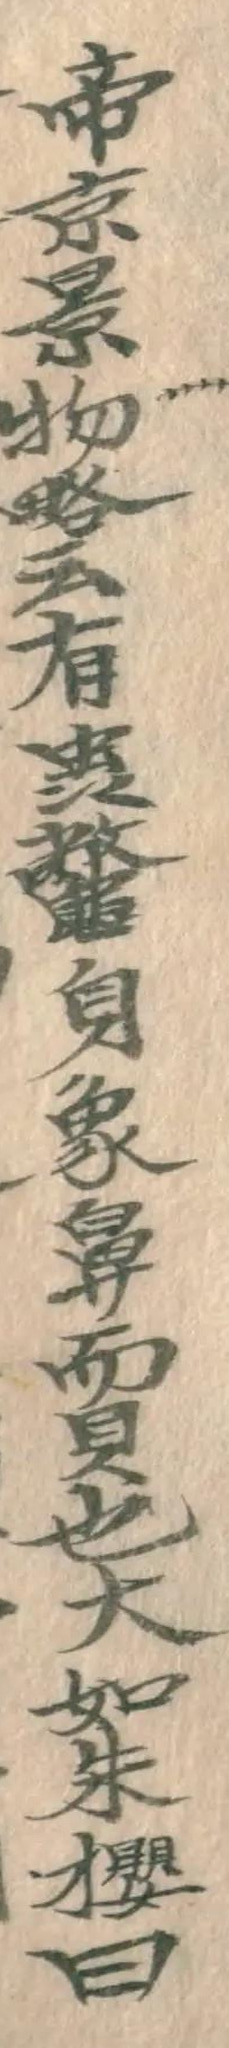帝京景物略云有蟲鼈身象鼻而具也大如朱櫻曰
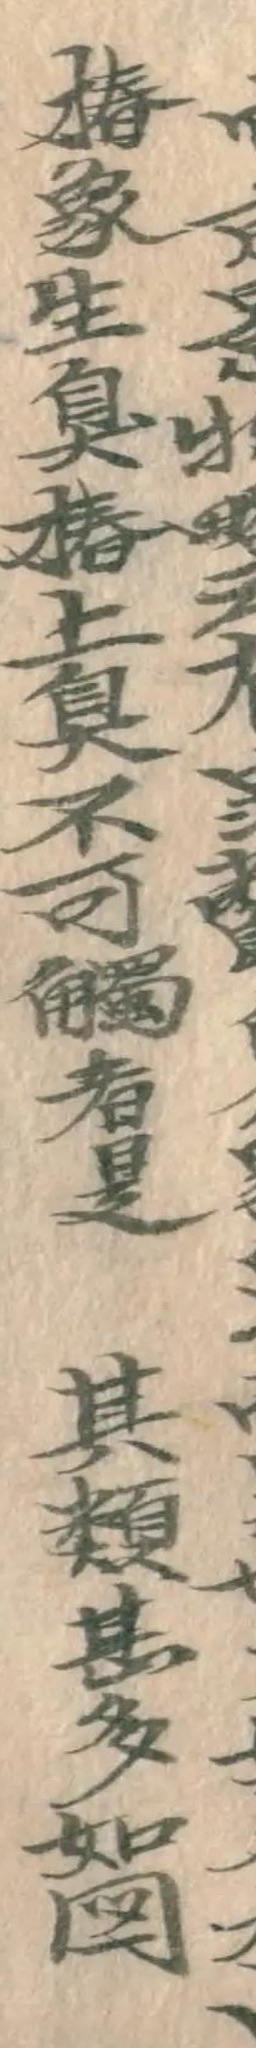椿象生臭椿上臭不可觸者是其類甚多如図

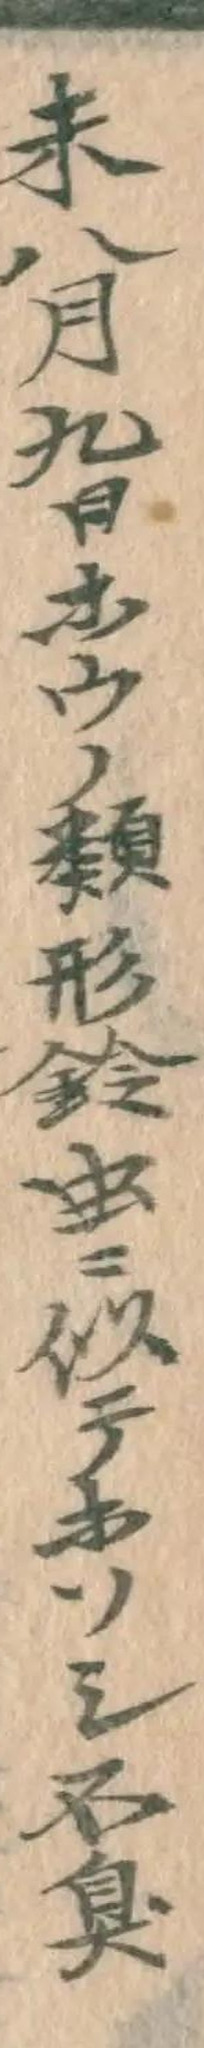未八月九日ホウノ類形鈴虫ニ似テホソシ不臭
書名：千蟲譜 3巻. [3]
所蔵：国立国会図書館 National Diet Library, JAPAN
